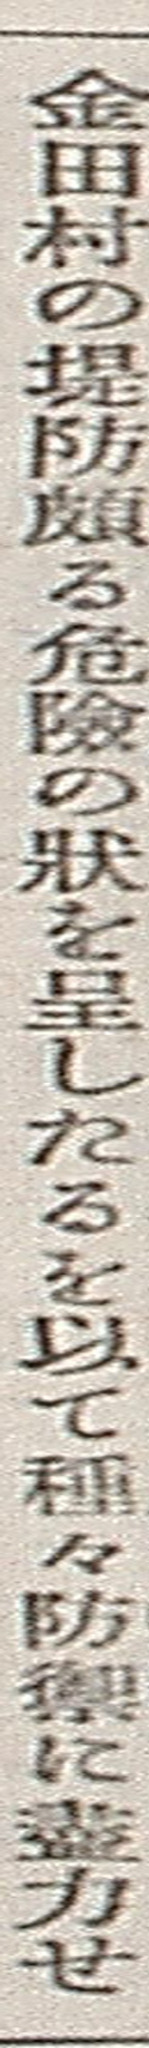金田村の堤防頗る危険の状を呈したるを以て種々防禦に尽力せ

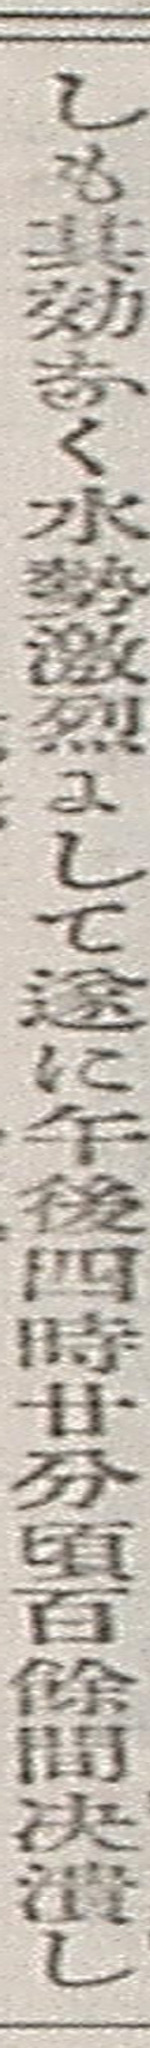しも其効なく水勢激烈にして遂に午後四時廿分頃百餘間决潰し
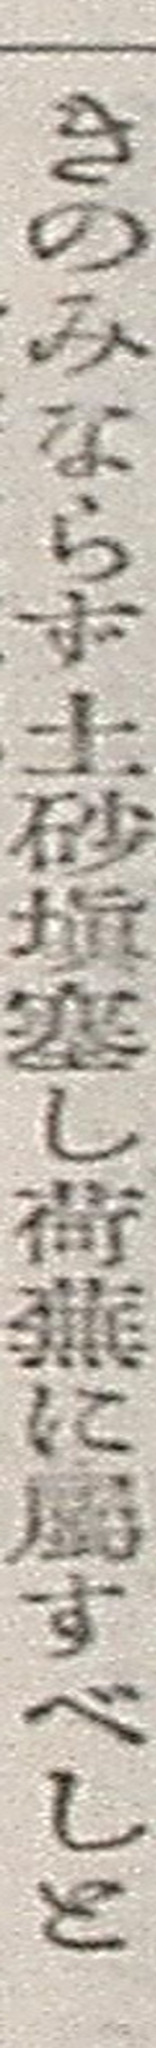きのみならず土砂填塞し荷蕪の属すべしと
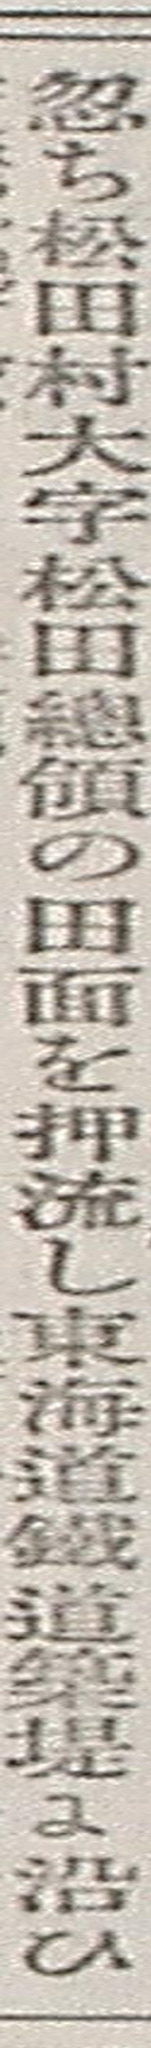忽ち松田村大字松田総領の田面を押流し東海道鉄道築堤に沿ひ
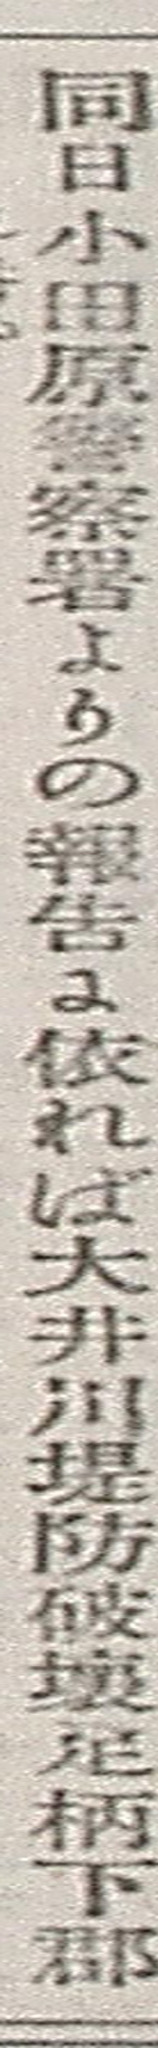同日小田原警察署よりの報告に依れば大井川堤防破壊足柄下郡
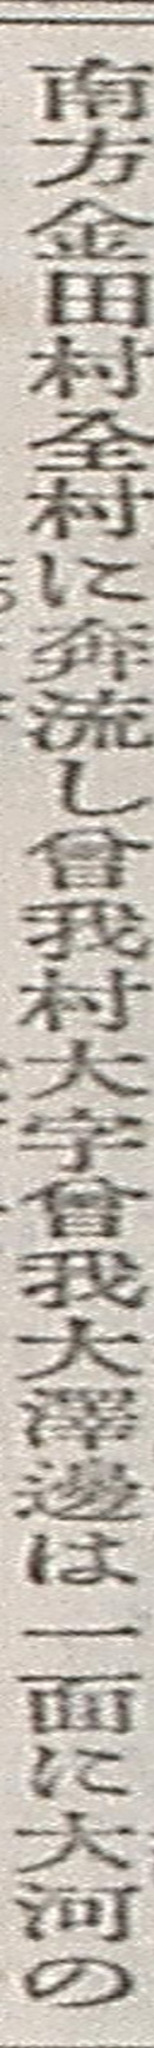南方金田村全村に奔流し曽我村大字曽我大沢辺は一面に大河の
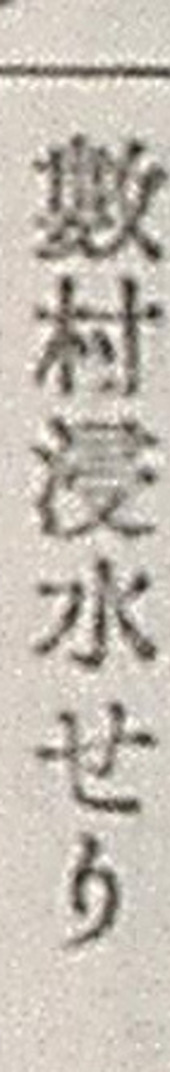数村浸水せり
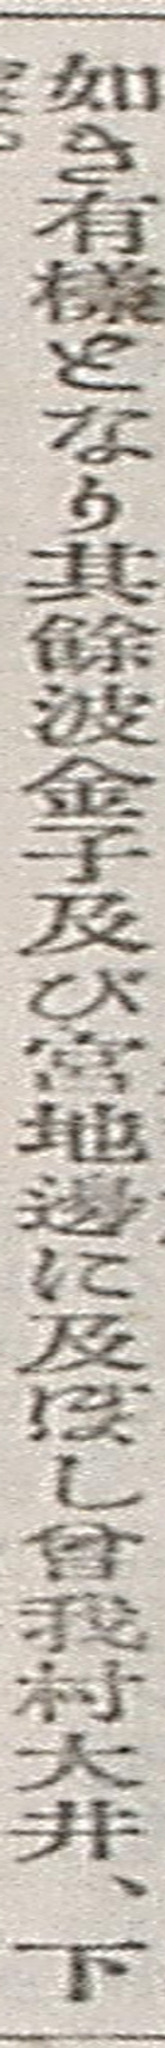如き有様なり其余波金子及び宮地辺に及ぼし曽我村大井、下
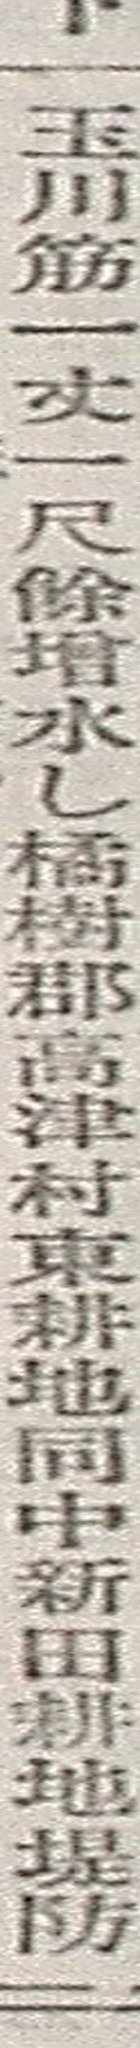玉川筋一丈一尺餘増水し橘樹郡高津村東耕地同中新田耕地堤防
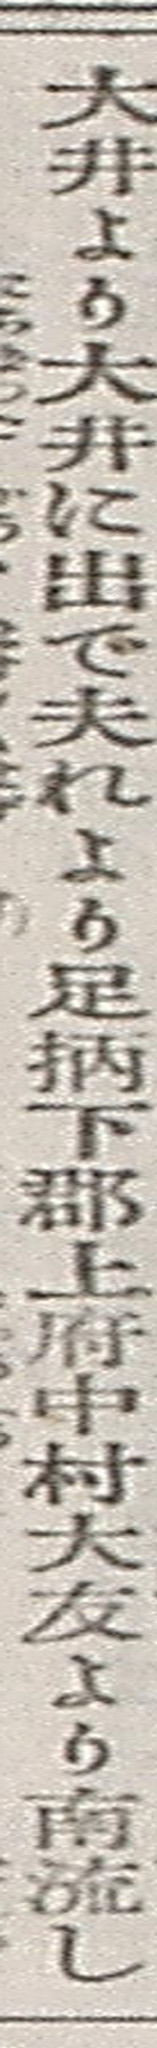大井より大井に出で夫れより足柄下郡上府中村大友より南流し
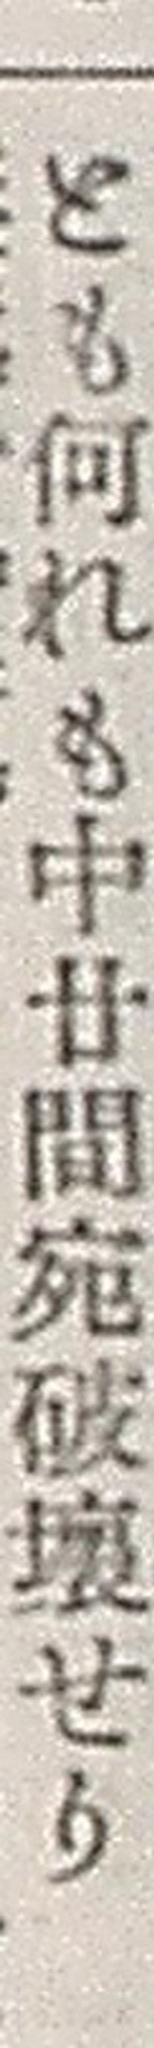とも何れも中廿間宛破壊せり
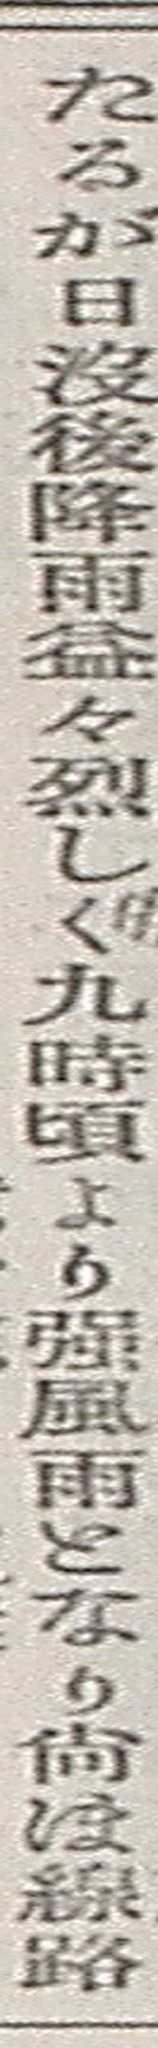たるが日没後降雨益々激しく九時頃より強風雨となり尚ほ線路
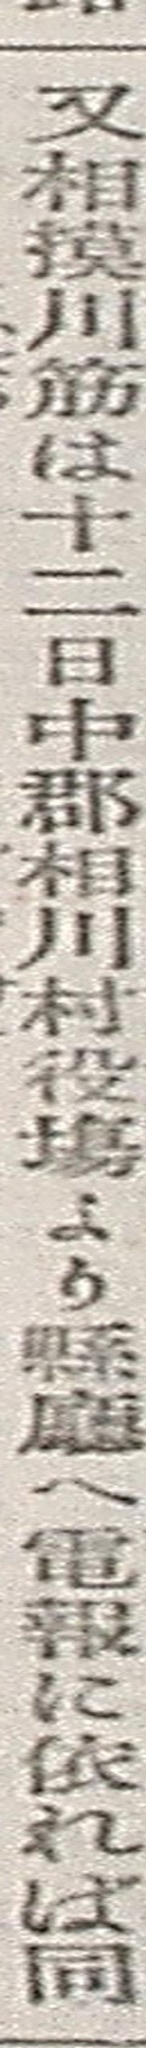又相模川筋は十二日中郡相川村役場より県庁へ電報に依れば同
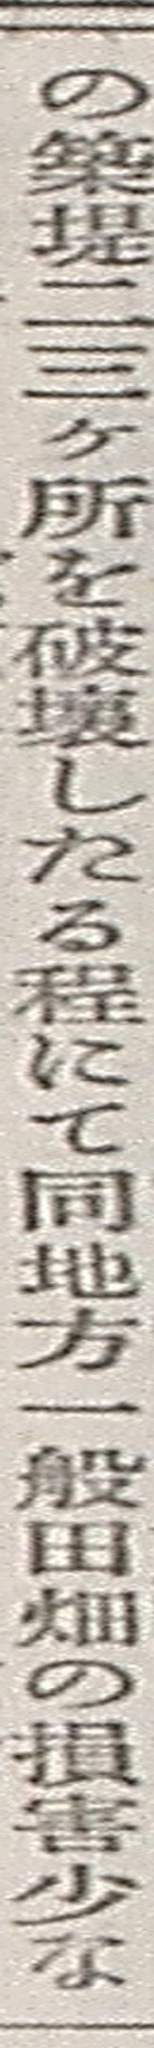の築堤二三ヶ所を破壊したる程にて同地方一般田畑の損害少な
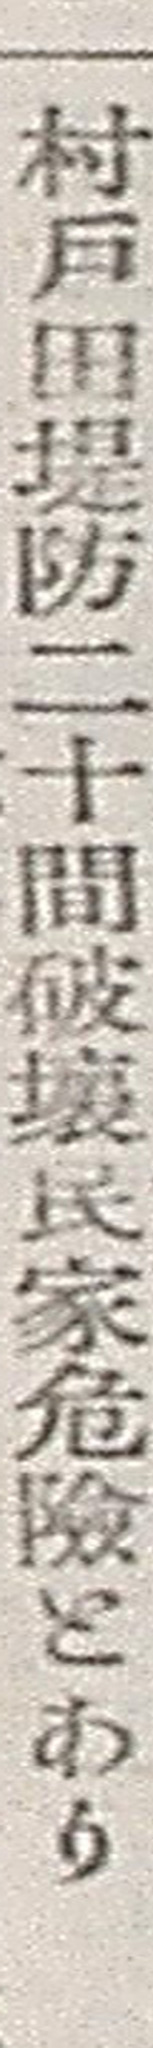村戸田堤防二十間破壊民家危険とあり
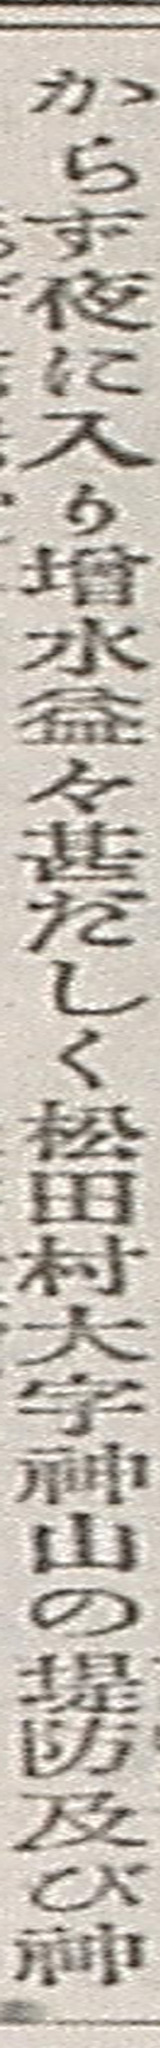からず夜に入り増水益々甚だしく松田村大字神山の堤防及び神
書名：風俗畫報臨時増刊第百二十八號　洪水被害録（下）
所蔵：東京大学地震研究所図書室 Earthquake Research Institute Library, The University of Tokyo, JAPAN
